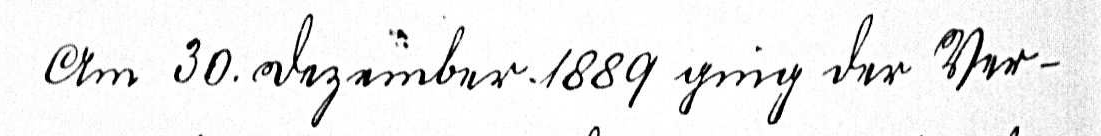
Am 30. Dezember 1889 ging der Ver¬
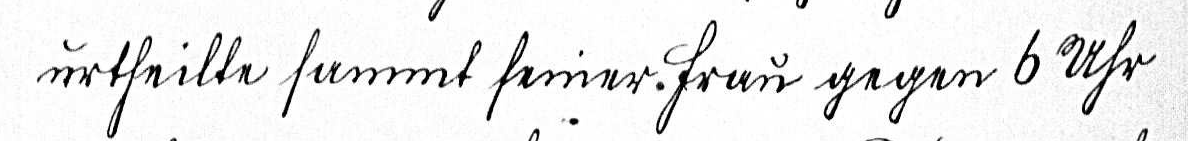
urtheilte sammt seiner Frau gegen 6 Uhr
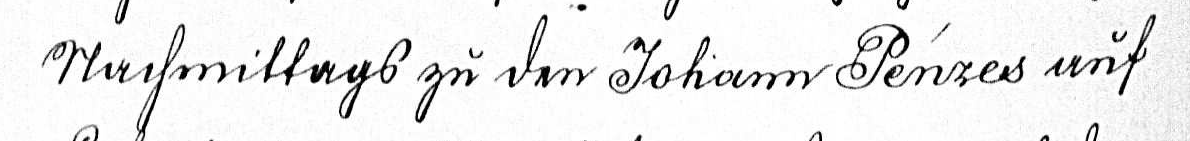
Nachmittags zu den Johann Pénzes auf
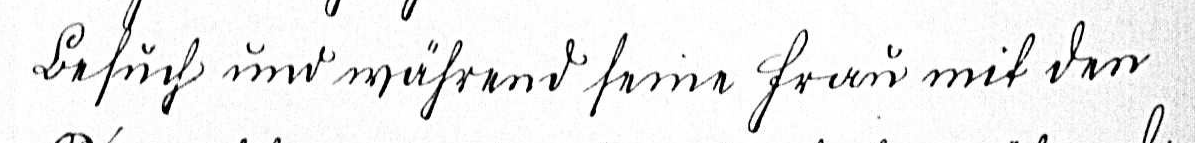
Besuch und während seine Frau mit den
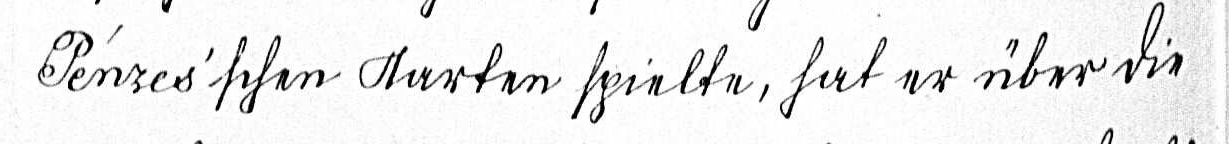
Pénzes’schen Karten spielte, hat er über die
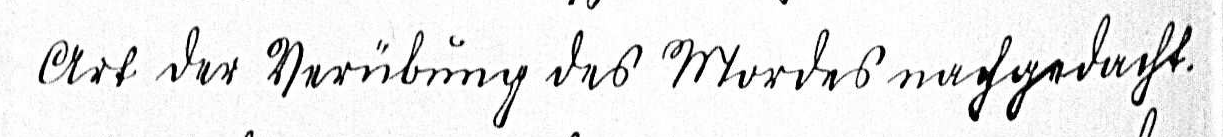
Art der Verübung des Mordes nachgedacht.
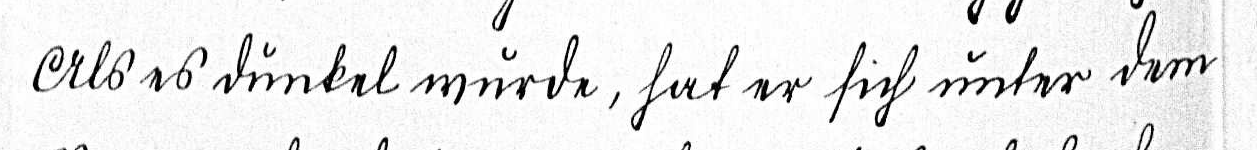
Als es dunkel wurde, hat er sich unter dem
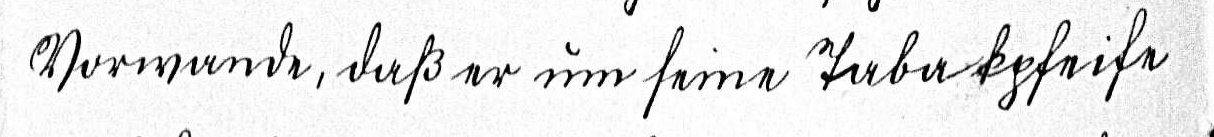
Vorwande, daß er um seine Tabakpfeife
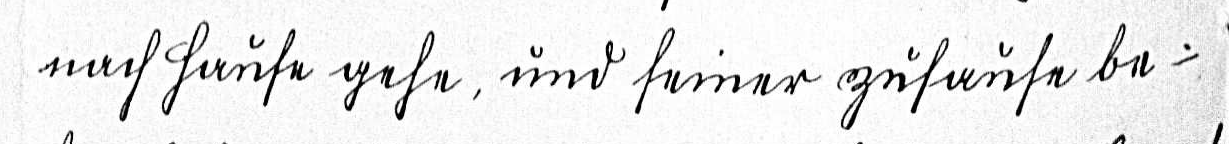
nach Hause gehe, und seiner zuhause be¬
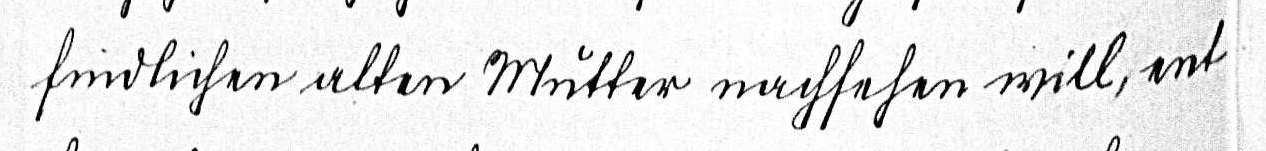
findlichen alten Mutter nachsehen will, ent¬
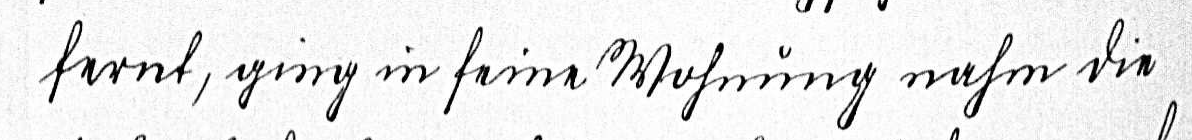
fernt, ging in seine Wohnung nahm die
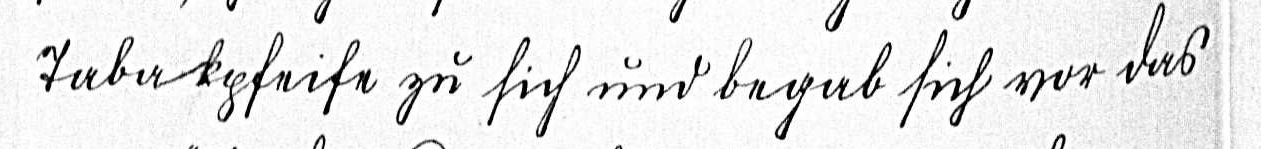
Tabakpfeife zu sich und begab sich vor das
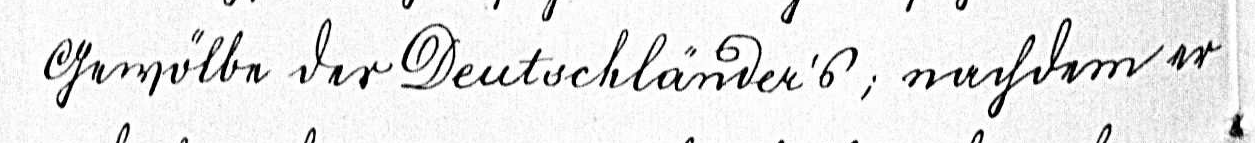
Gewölbe der Deutschländer’s; nachdem er
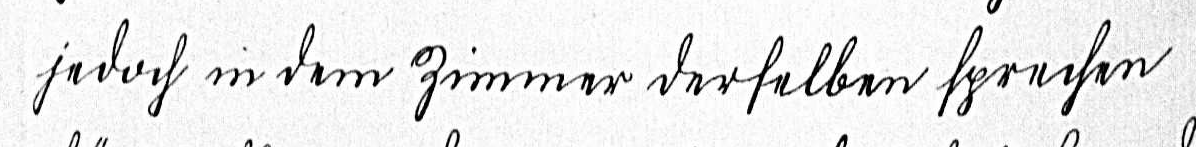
jedoch in dem Zimmer derselben sprechen
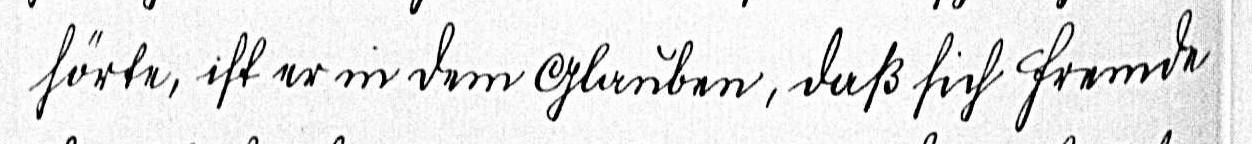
hörte, ist er in dem Glauben, daß sich fremde
